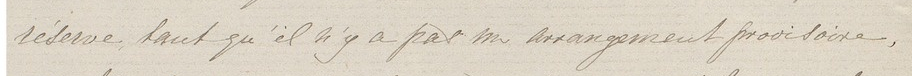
réserve, tant qu'il n'y a pas un arrangement provisoire,
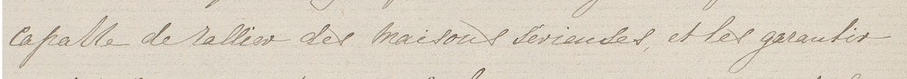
capable de rallier des maisons serieuses, et les garantir
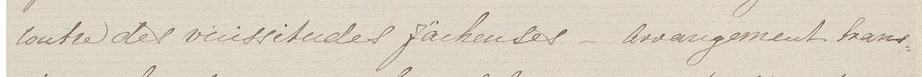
contre des vicissitudes fâcheuses – arrangement trans-
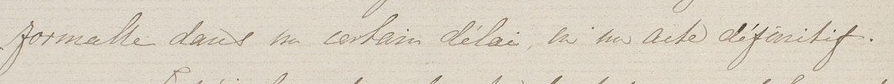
formable dans un certain délai, en un acte définitif.
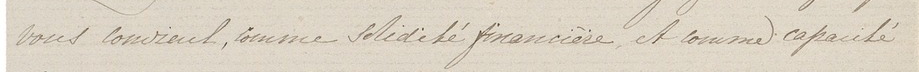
vous convient, comme solidité financière, et comme capacité
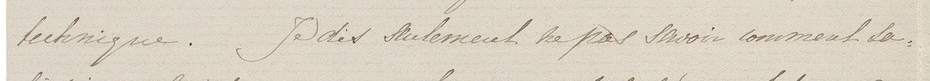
technique. Je dis seulement ne pas savoir comment sa-
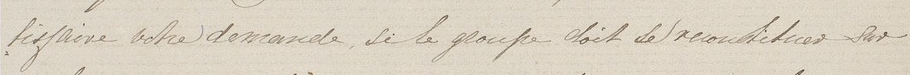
tisfaire votre demande, si le groupe doit se reconstituer sur
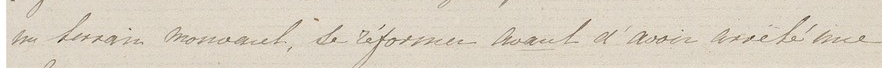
un terrain mouvant, se réformer avant d'avoir arrêté une
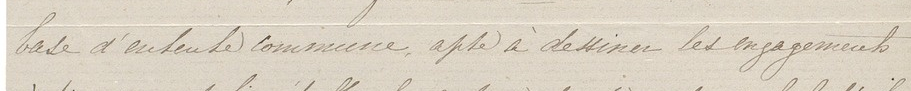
base d'entente commune, apte à dessiner les engagements
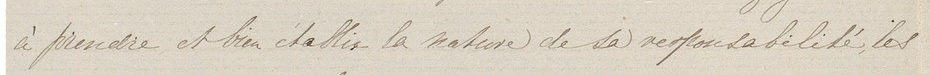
à prendre et bien établir la nature de sa responsabilité, les
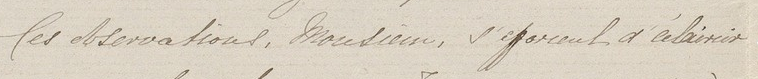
Les observations, Monsieur, s'eforcent d'éclaircir
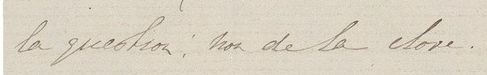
la question: non de la clore.
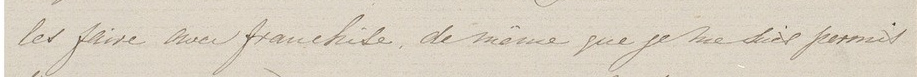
les faire avec franchise, de même que je me suis permis
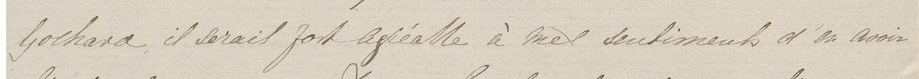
Gothard, il serait fort agréable à mes sentiments d'en avoir
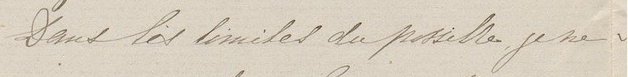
Dans les limites du possible je ne
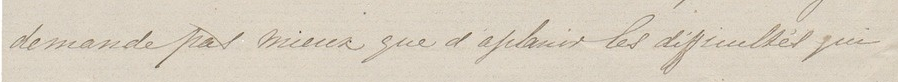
demande pas mieux que d'aplanir les difficultés qui
